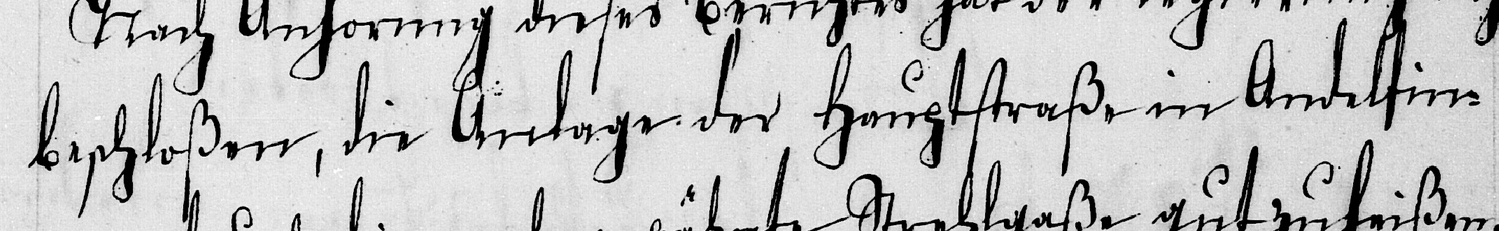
beschloßen, die Anlage der Hauptstraße in Andelfin¬
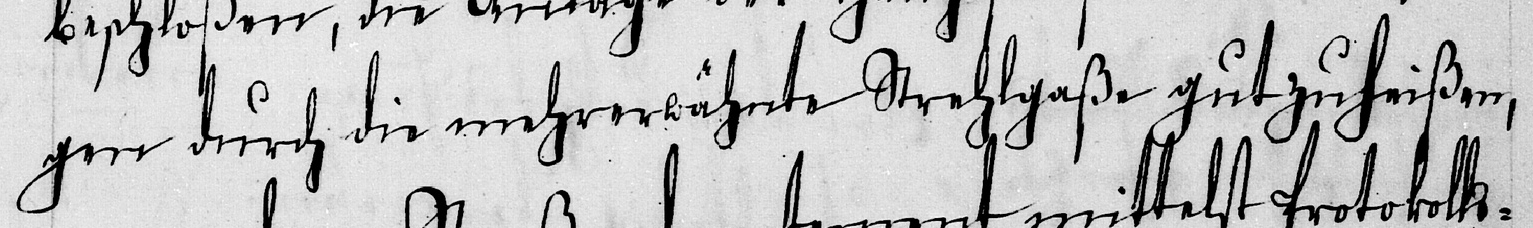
gen durch die mehrerwähnte Strehlgaße gutzuheißen,
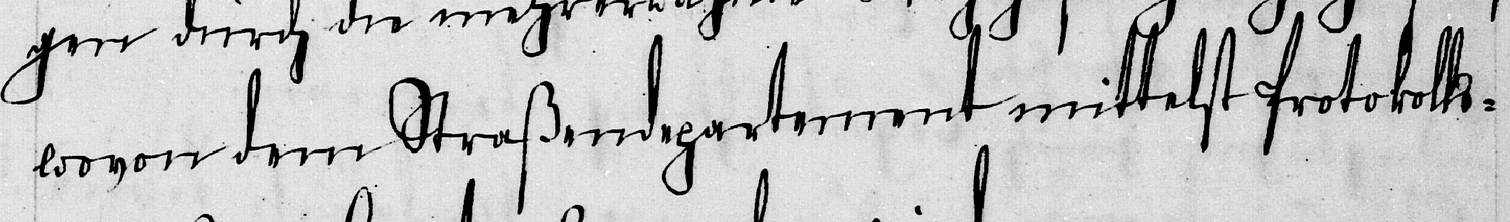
wovon dem Straßendepartement mittelst Protokoll¬
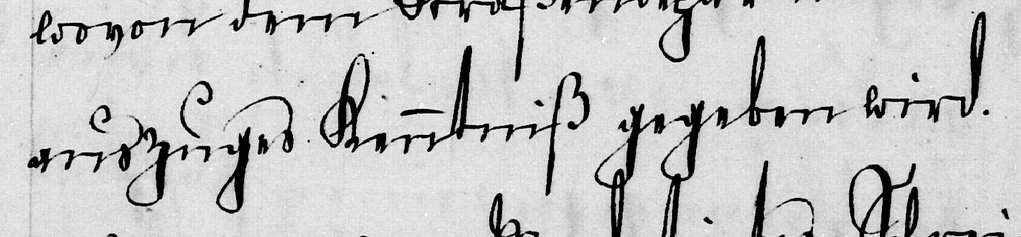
sauszuges Kenntniß gegeben wird.
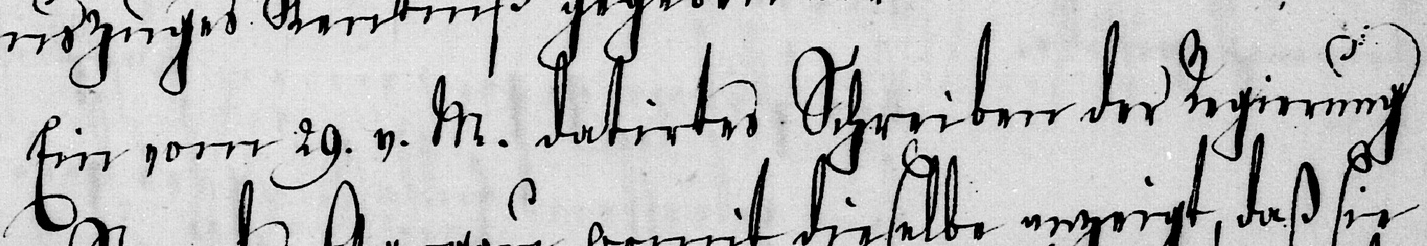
Ein vom 29. v. M. datirtes Schreiben der Regierung
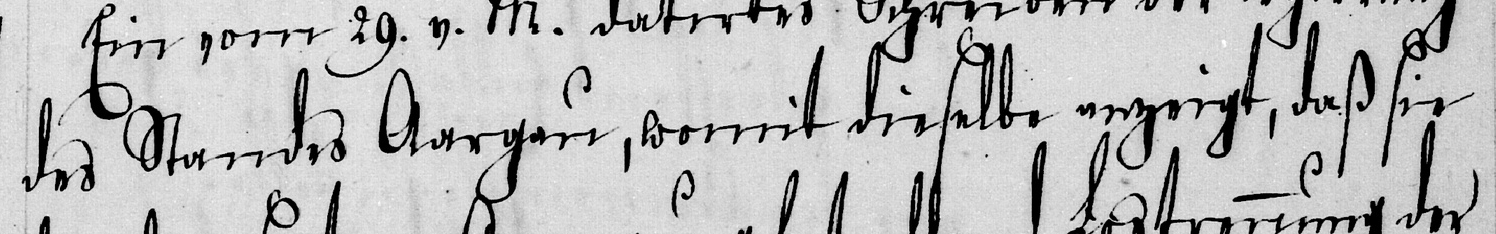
des Standes Aargau, womit dieselbe anzeigt, daß sie
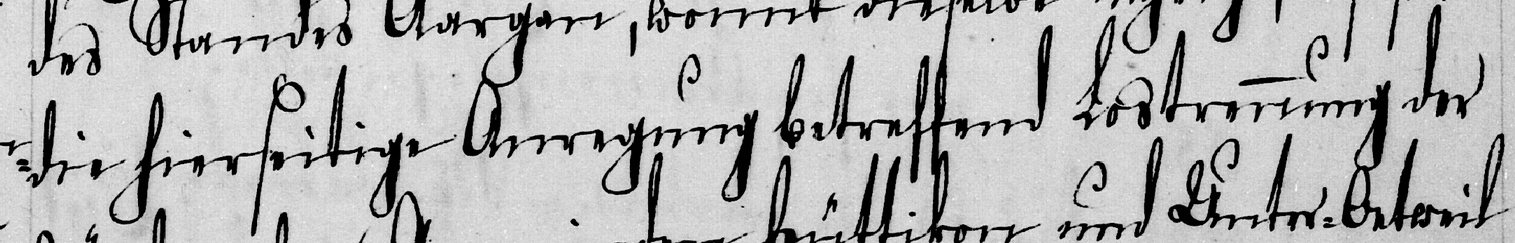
die hierseitige Anregung betreffend Lostrennung der
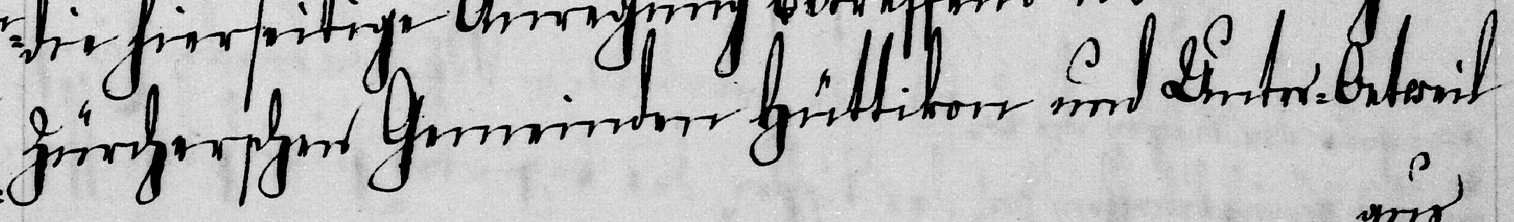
Zürcherschen Gemeinden Hüttikon und Unter-Oetweil
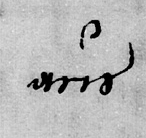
auf
